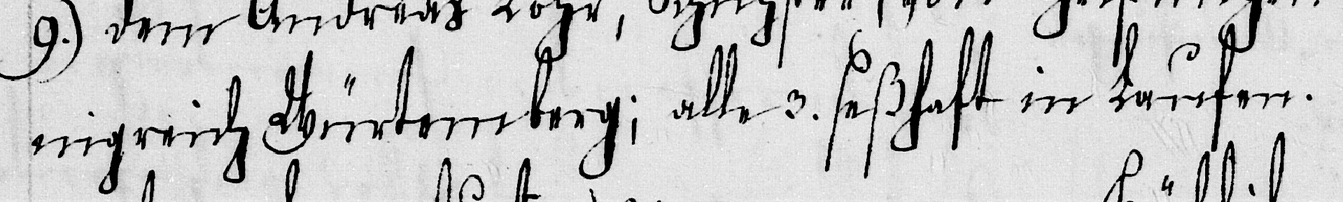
nigreich Würtemberg; alle 3. seßhaft in Laufen.
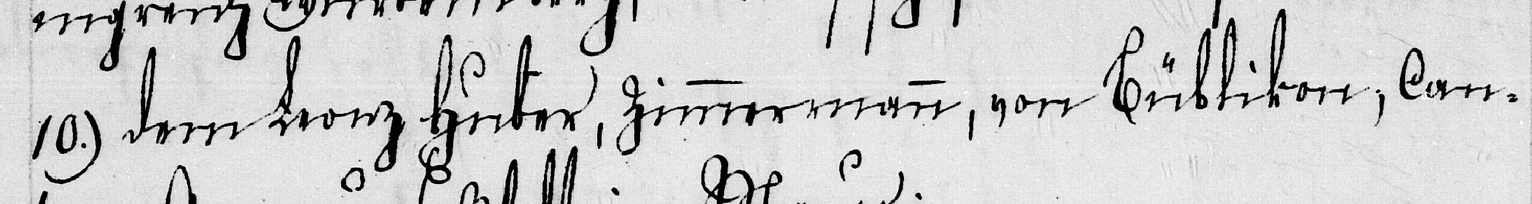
10.) dem Franz Huber, Zimmermann, von Büblikon, Can¬
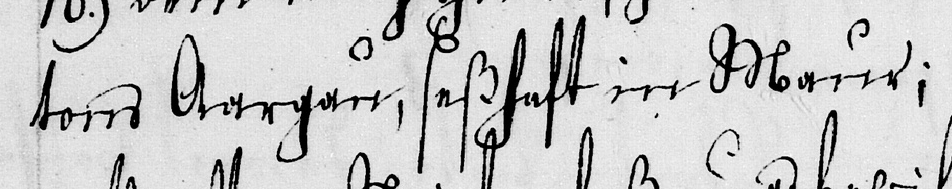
tons Aargau, seßhaft in Maur;
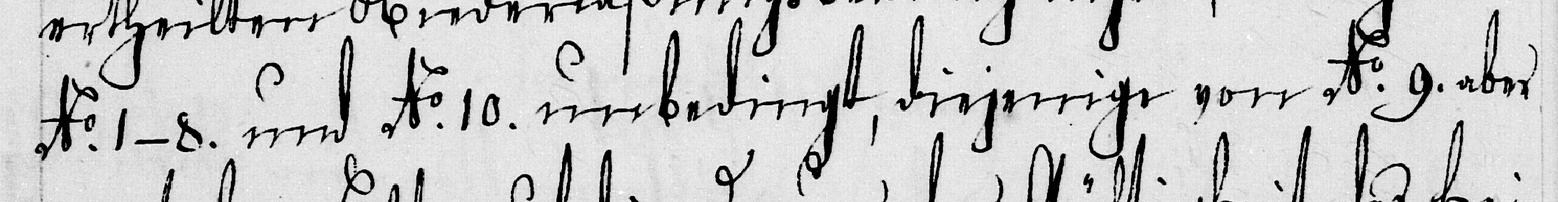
No. 1–8. und No. 10. unbedingt, diejenige von No. 9. aber
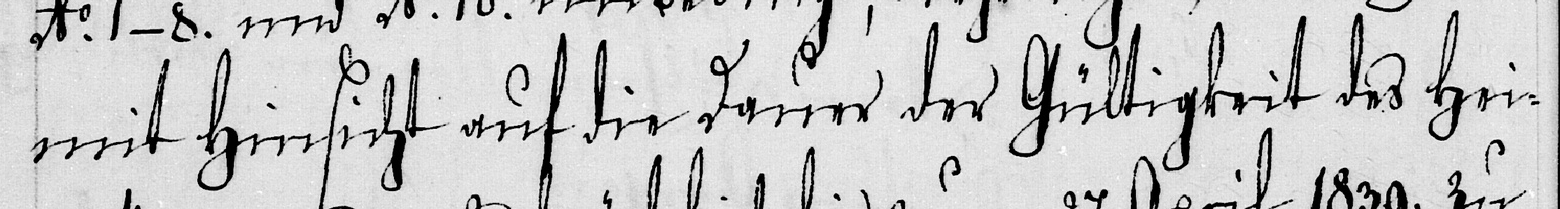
mit Hinsicht auf die Dauer der Gültigkeit des Hei¬
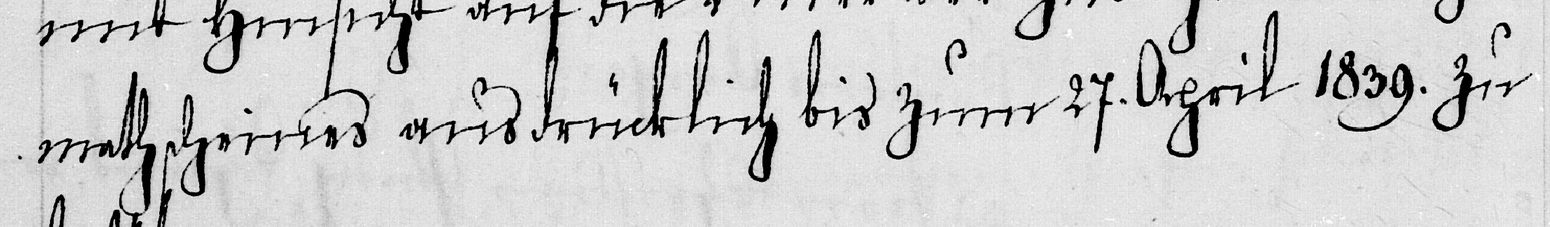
mathscheins ausdrücklich bis zum 27. April 1839. zu
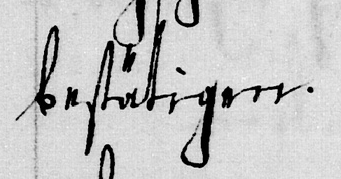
bestätigen.
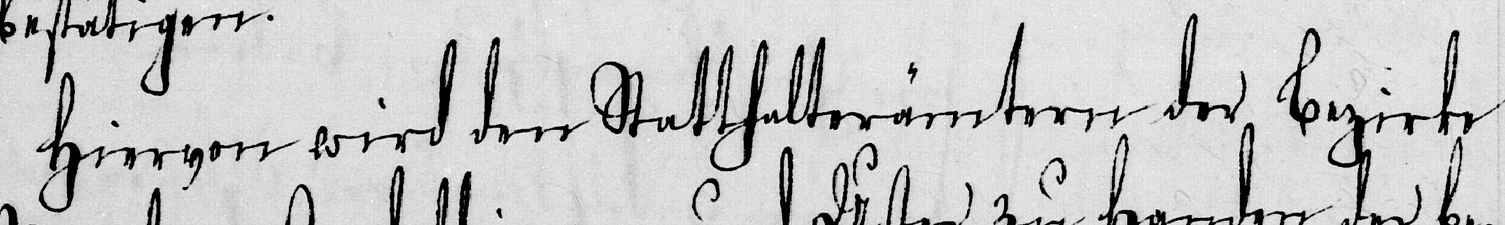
Hiervon wird den Statthalterämtern der Bezirke
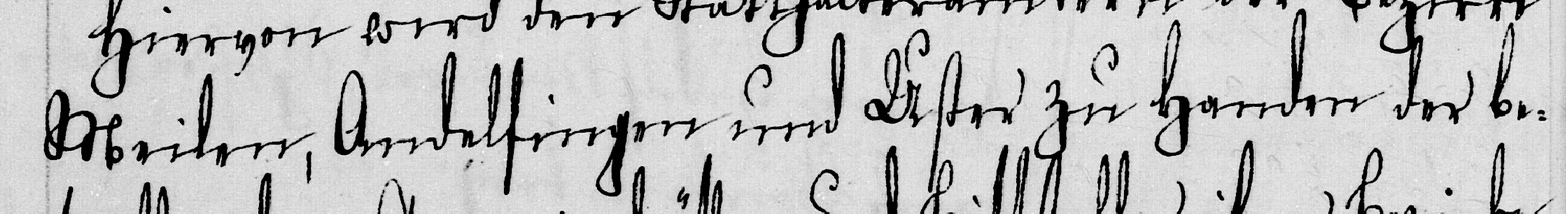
Meilen, Andelfingen und Uster zu Handen der be¬
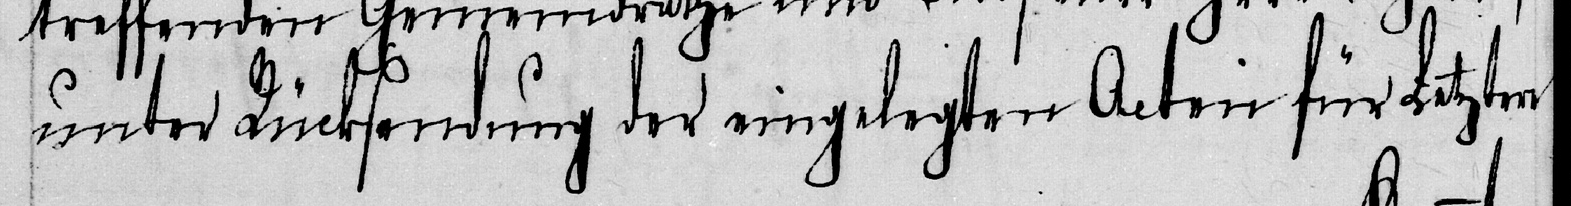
unter Rücksendung der eingelegten Acten für Letzere
